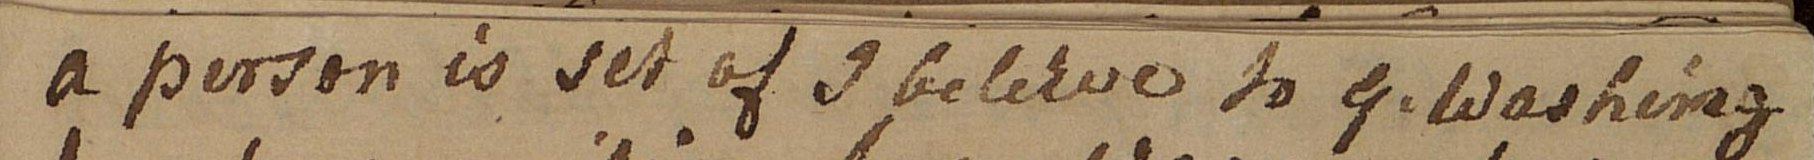a person is set of I believe to G. Washing
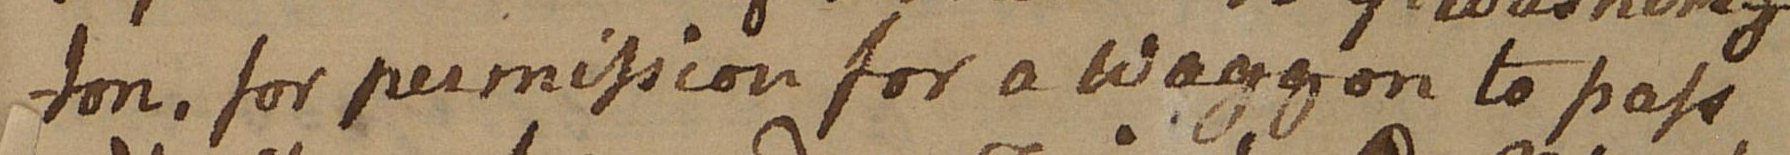-ton, for permission for a Waggon to pass
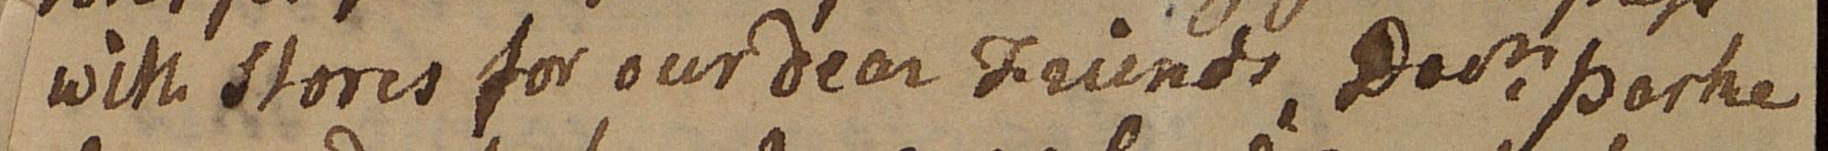with stores for our dear Friends, Doc^r. Parke
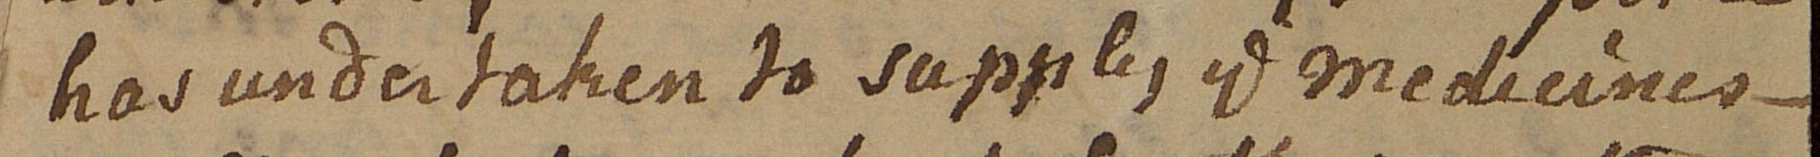has under taken to supply y^e medicines-
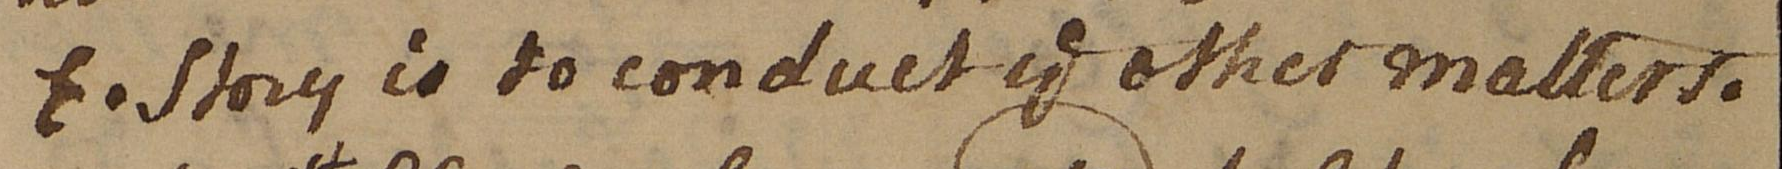E. Story is to conduct y^e other matters.
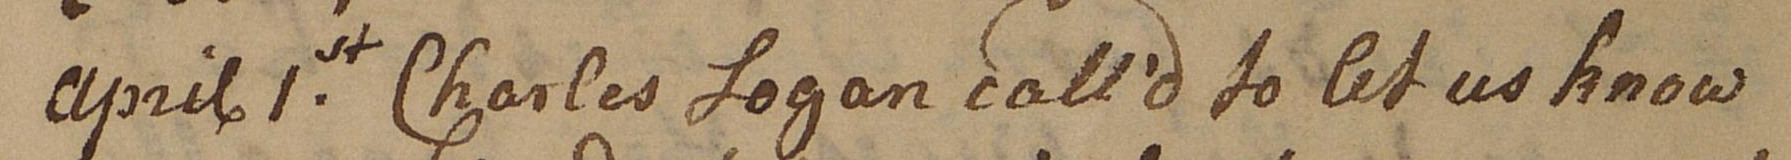April 1^st. Charles Logan call'd to let us know
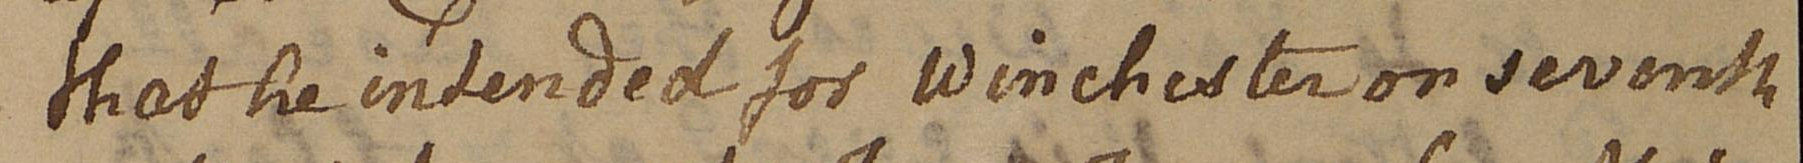that he intended for Winchester on seventh
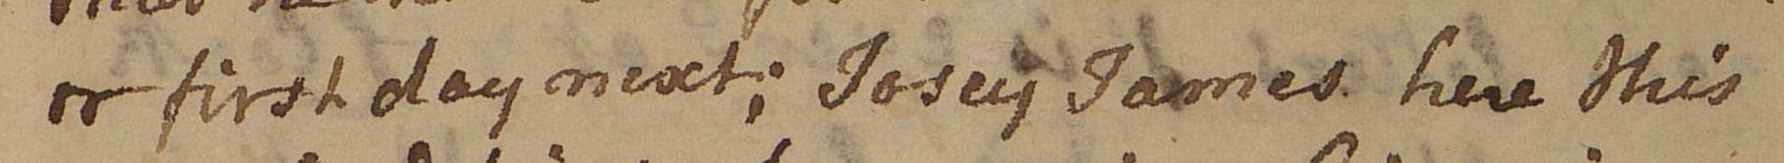or first day next; Josey James here this
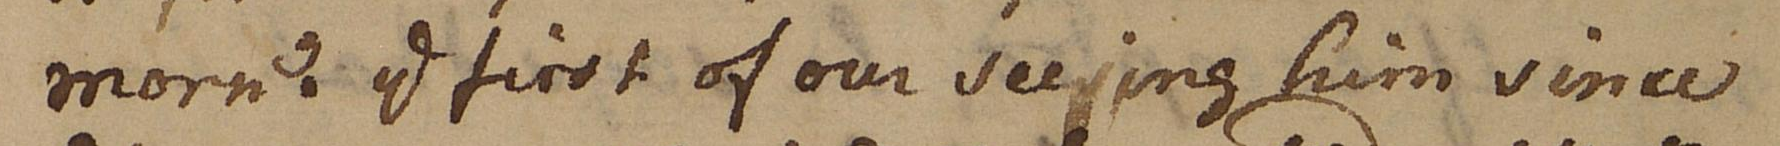morn^g. y^e first of our seeing him since
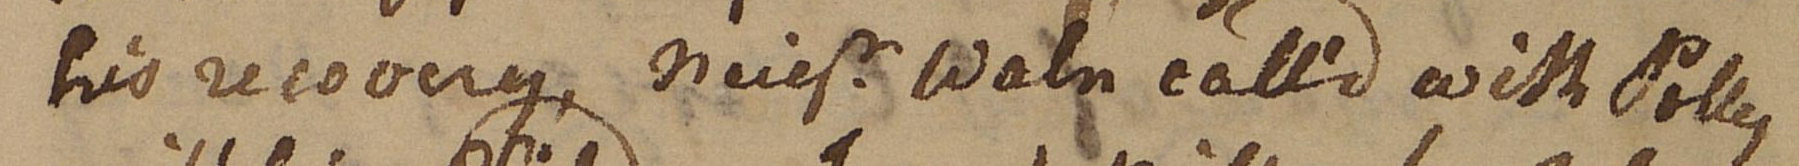his recovery, Neig^r. Waln call'd with Polly
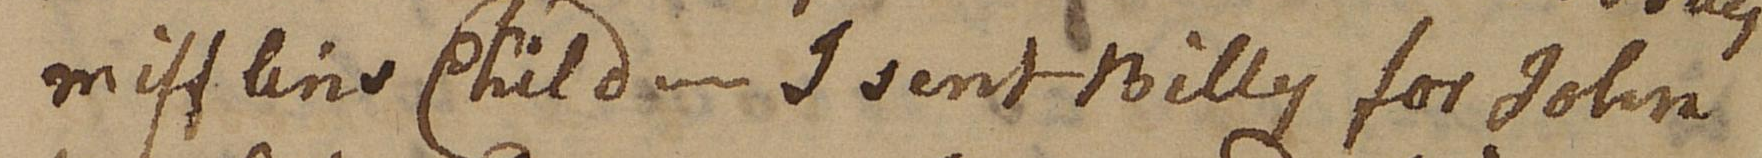mifflins Child- I sent Billy for John
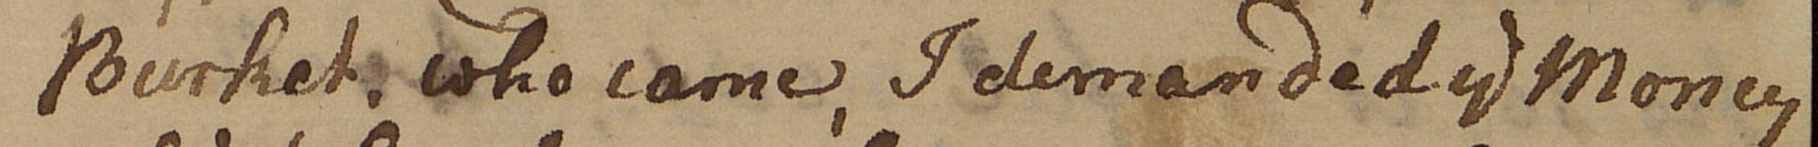Burket, who came, I demanded y^e Money
